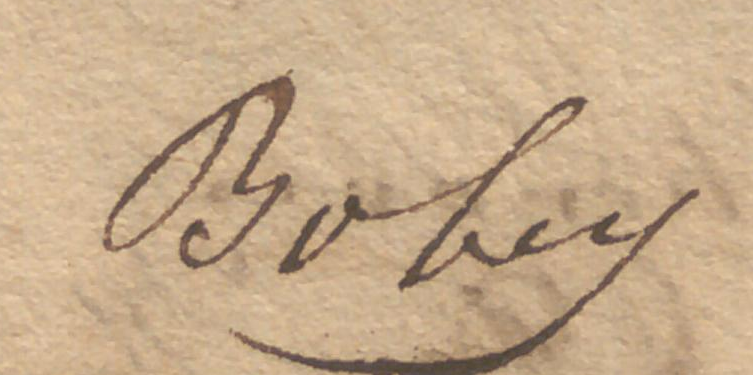Bobey
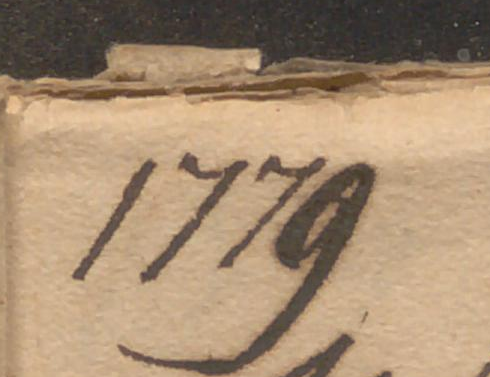1779
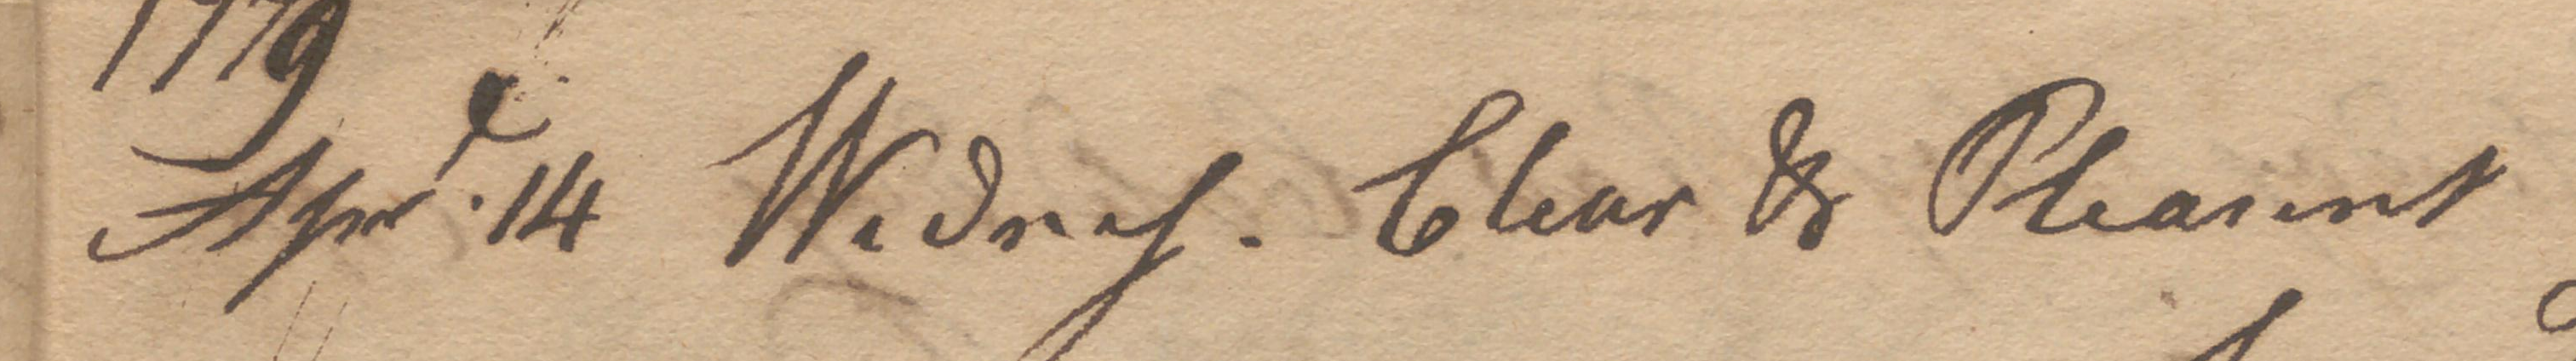Apr^l. 14 Wednes. Clear & Pleasent
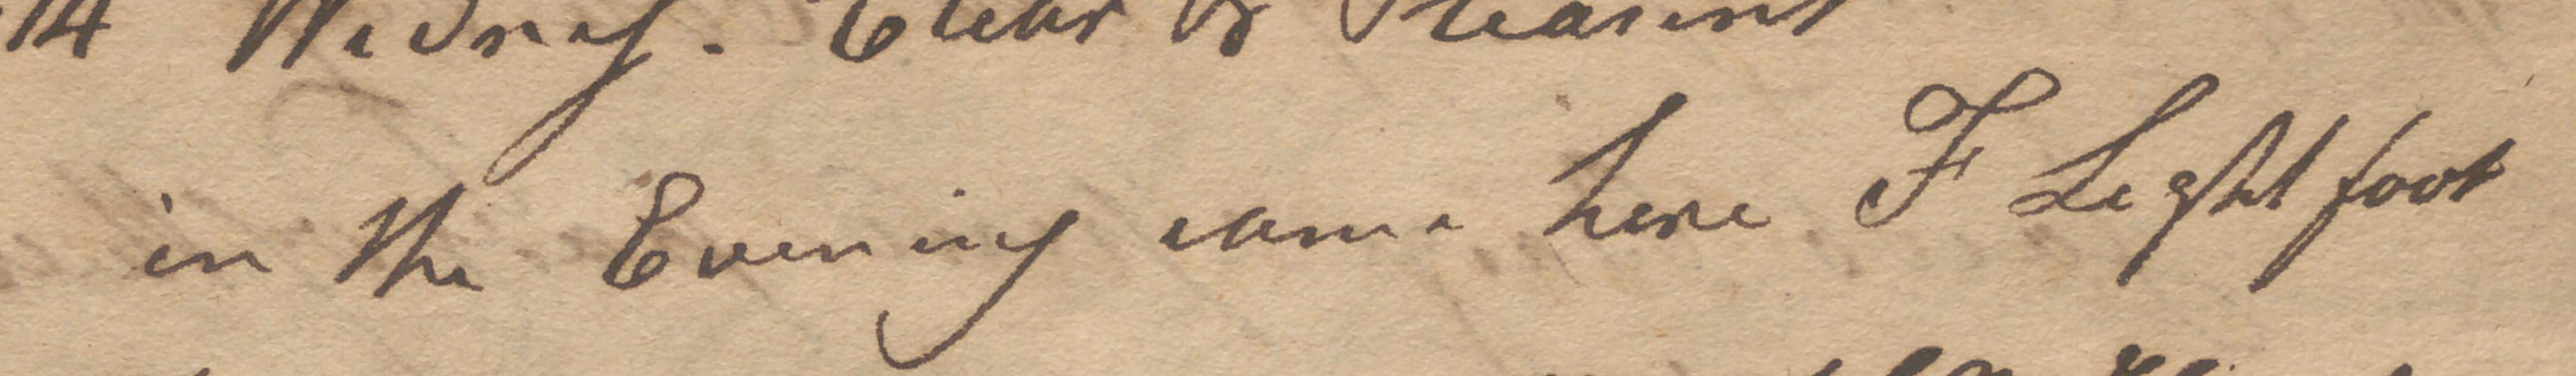in the Evening came here F Lightfoot
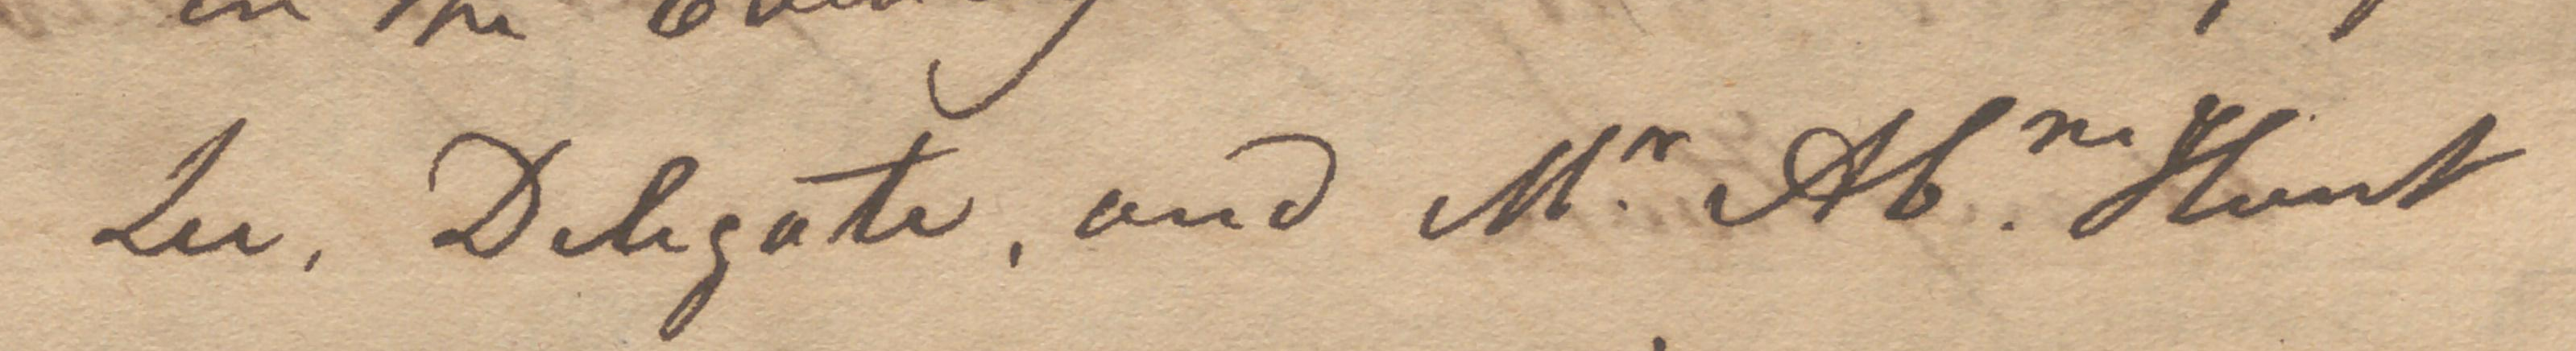Lee, Delegate, and M^r. Ab^m. Hunt
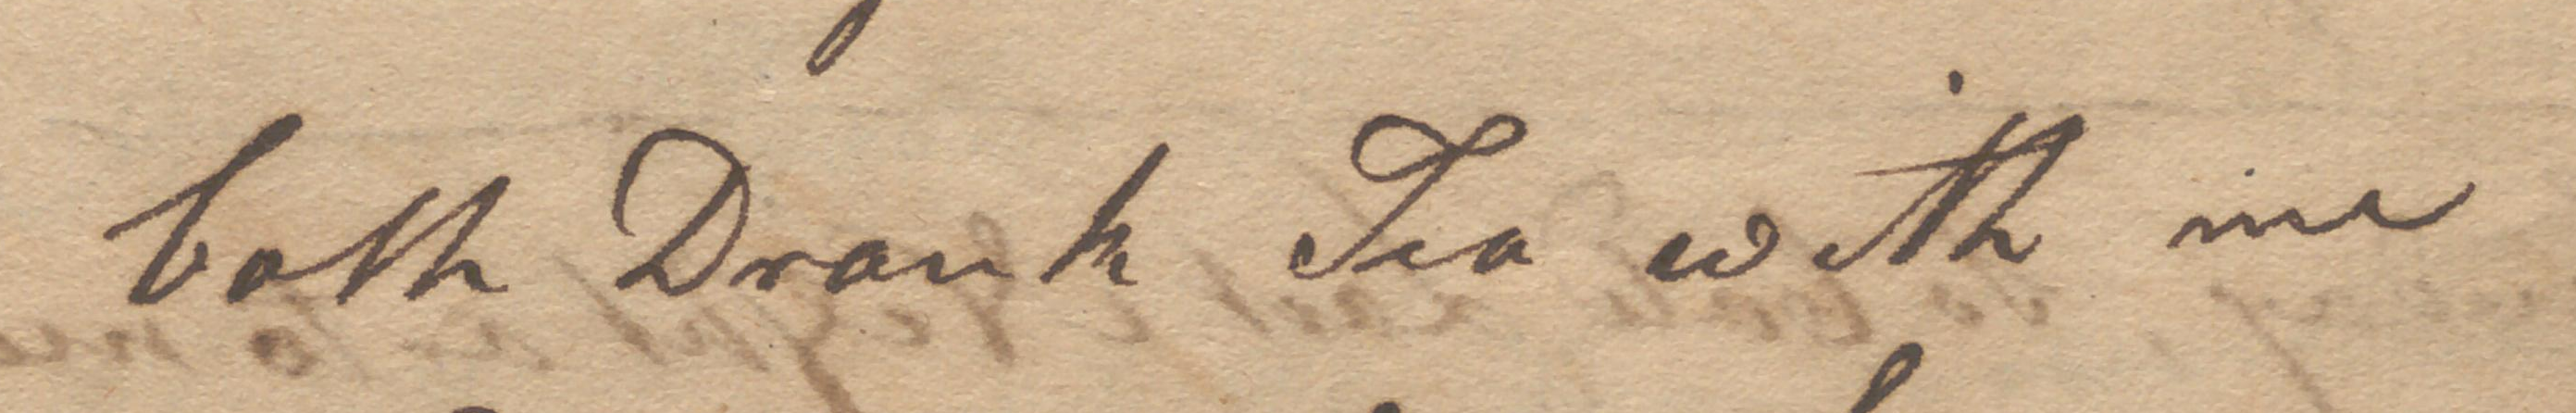both Drank Tea with me
